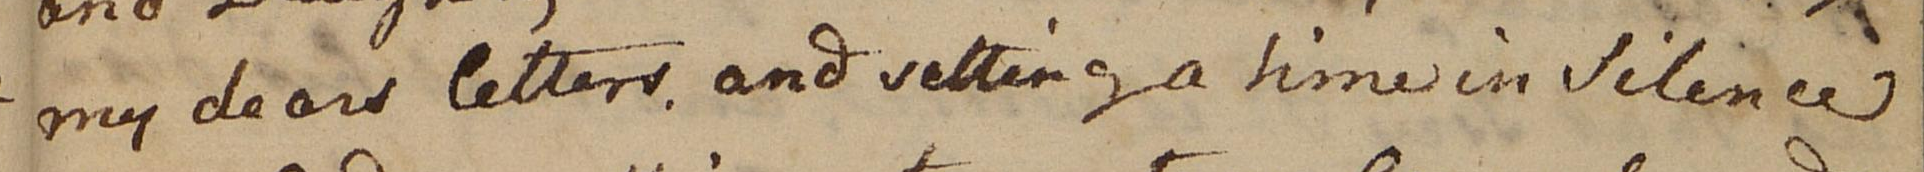my dears letters, and setting a time in silence
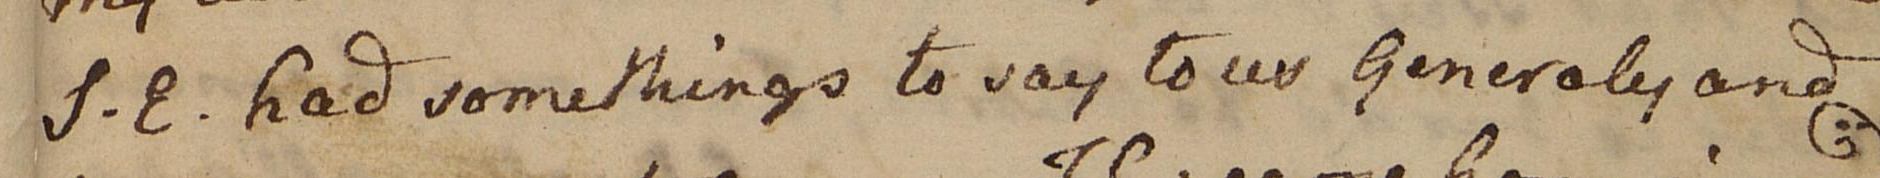S.E. had somethings to say to us Generaly and
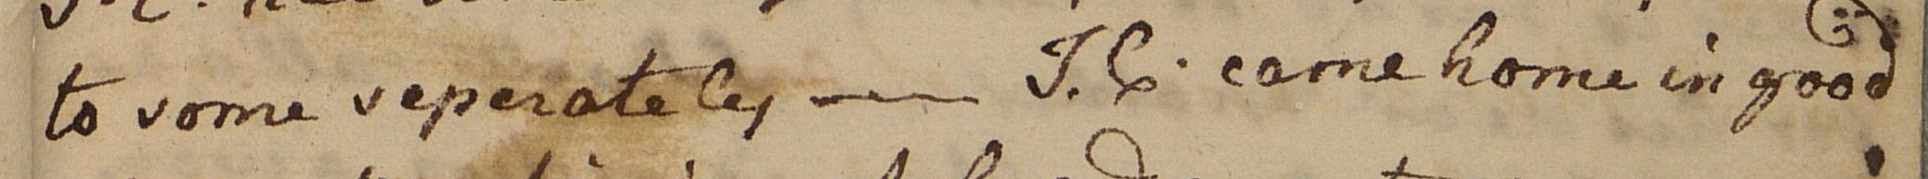to some seperately- I.C. came home in good
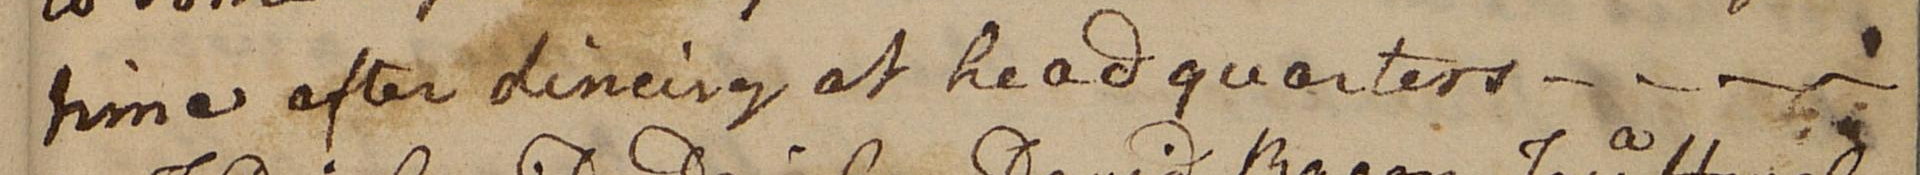time after dineing at headquarters-
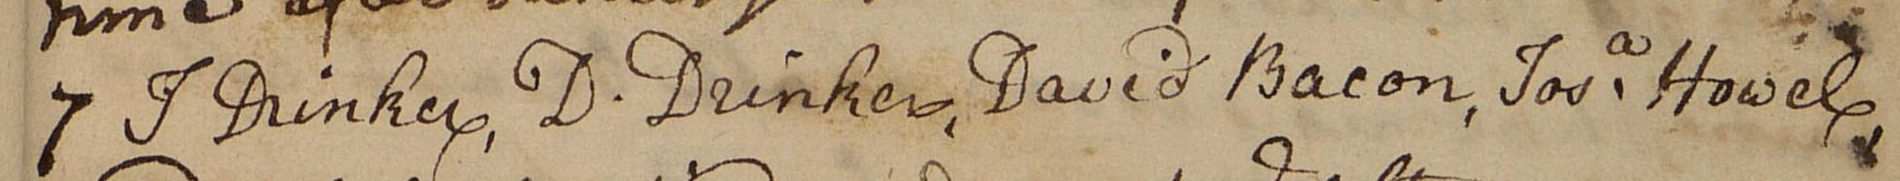7 I Drinker, D. Drinker, David Bacon, Jos^a. Howel,
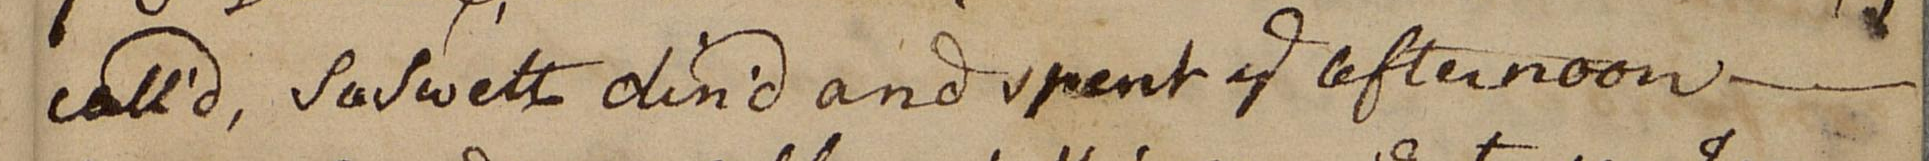call'd, S. Swett din'd and spent y^e afternoon-
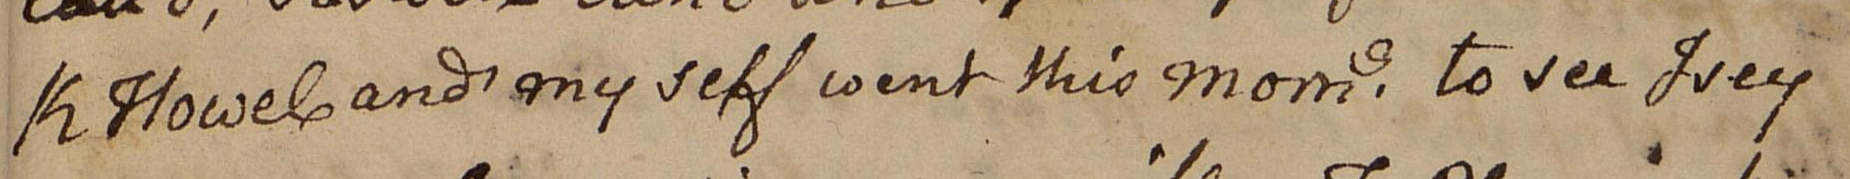K Howel, and my self went this Morn^g. to see Jsey
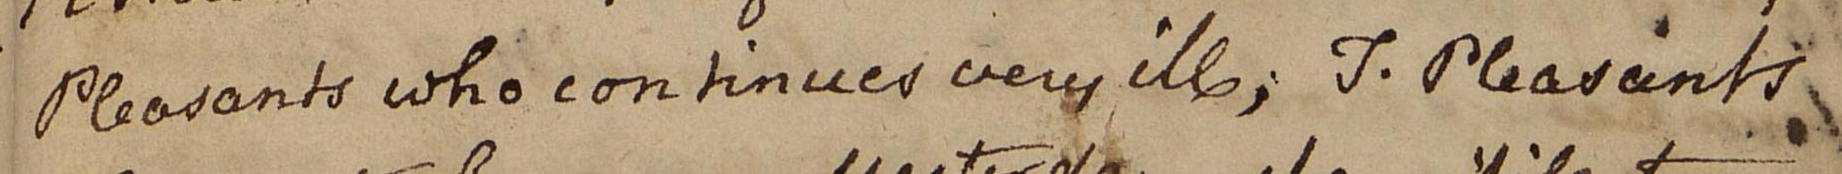Pleasants who continues very ill; S. Pleasants
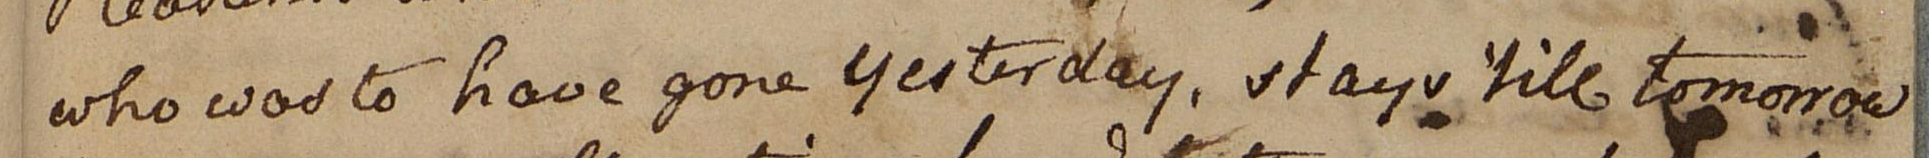who was to have gone Yesterday, stays 'till tomorrow
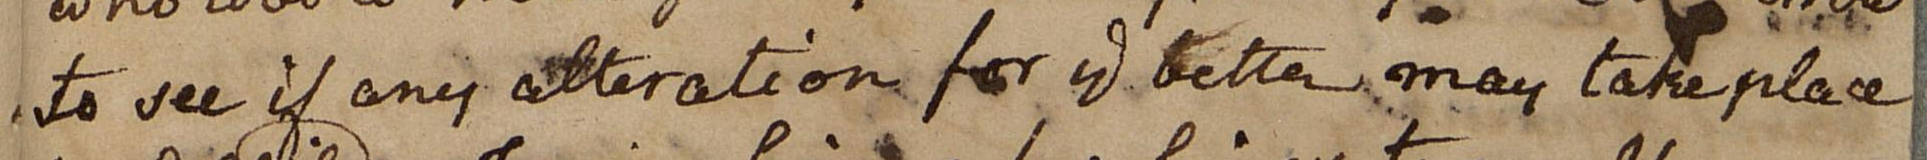to see if any alteration for y^e better may take place
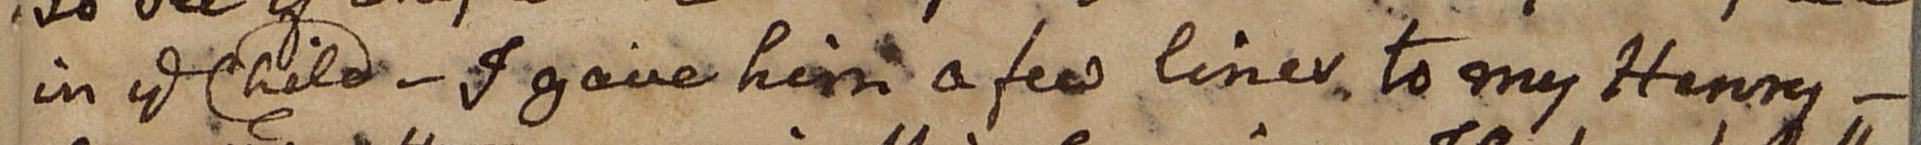in y^e Child- I gave him a few lines to my Henry-
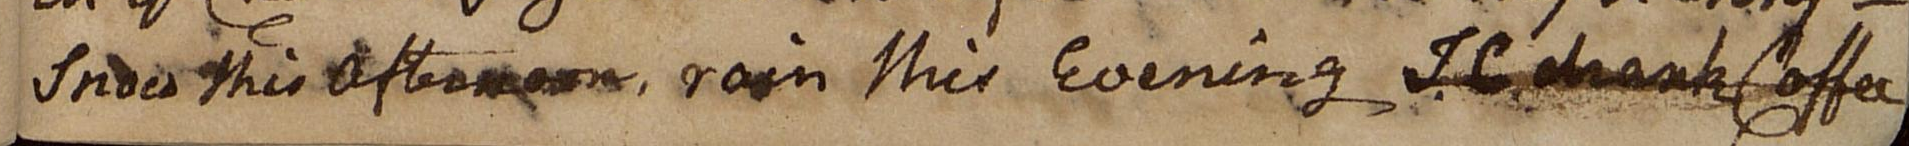Snow this Afternoon, rain this Evening & J. C. drank Coffee
